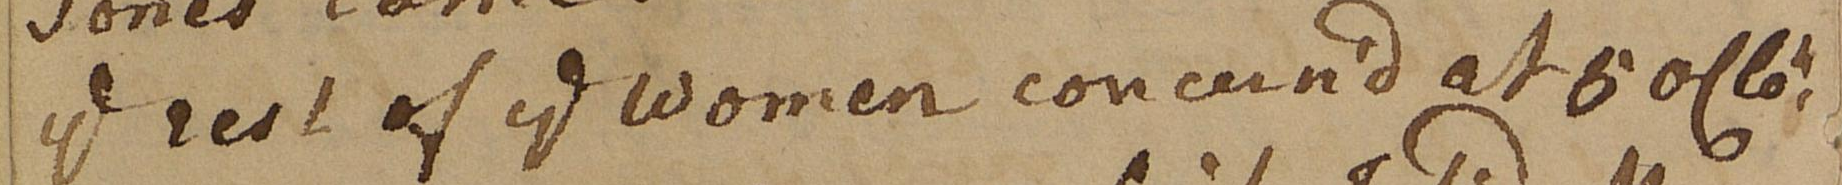y^e rest of y^e women concern'd at 5 ^o Clo^k
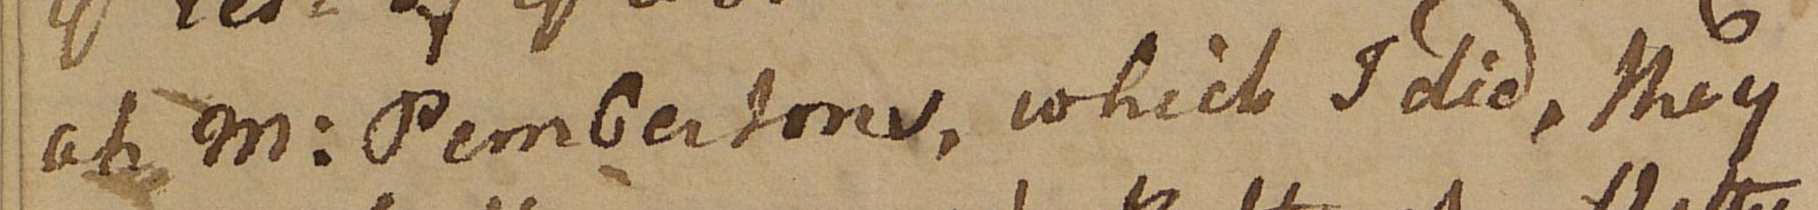at M: Pembertons, which I did, they
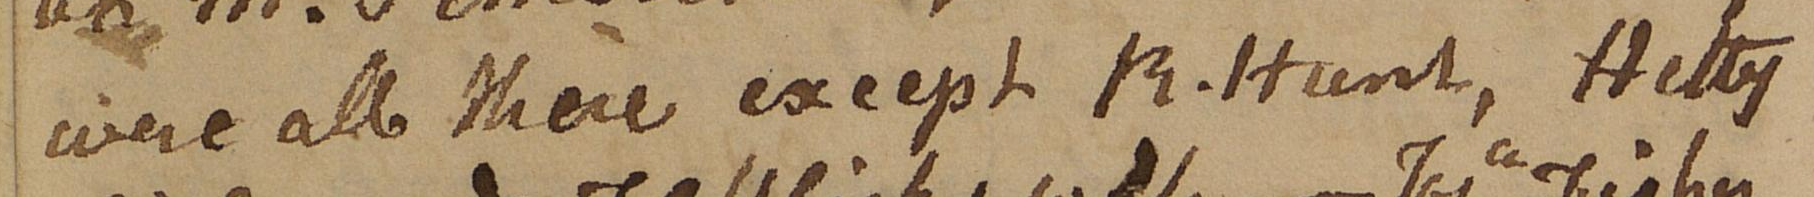were all there except R. Hunt, Hetty
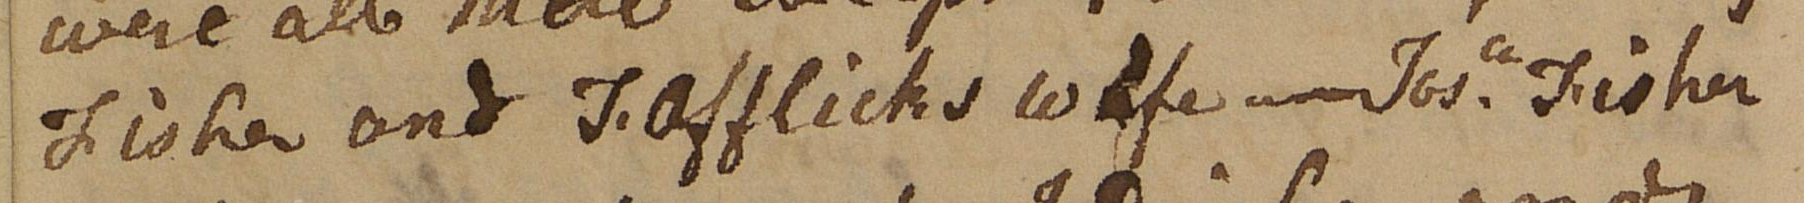Fisher and T. Afflicks wife- Jos^a. Fisher
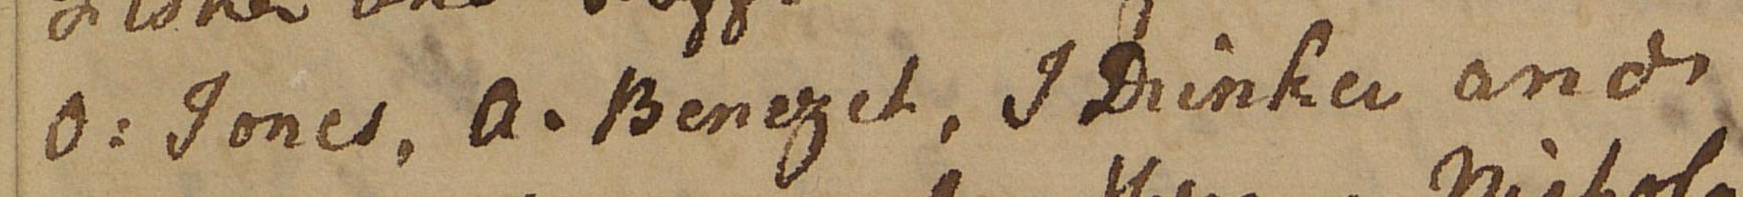O: Jones, A. Benezet, J Drinker and
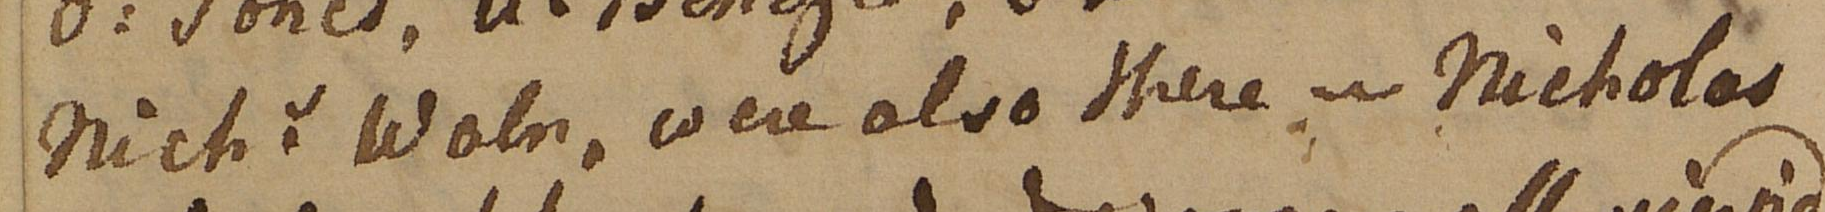Nich^s. Waln, were also there- Nicholas
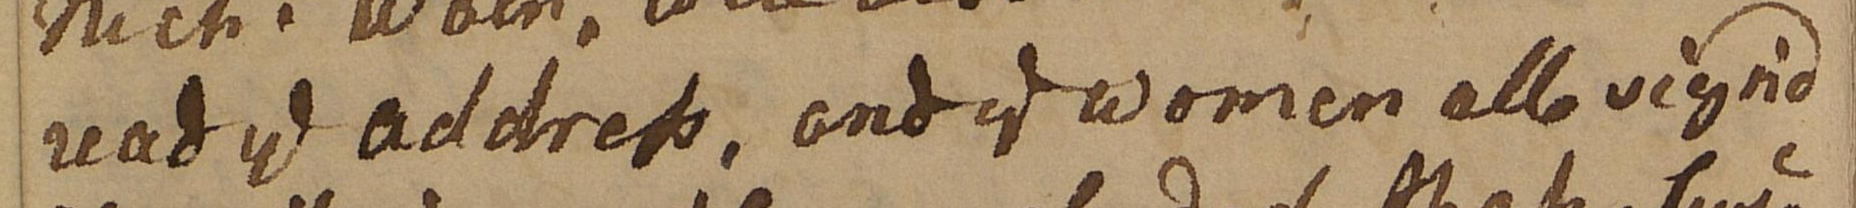read y^e address, and y^e women all sign'd
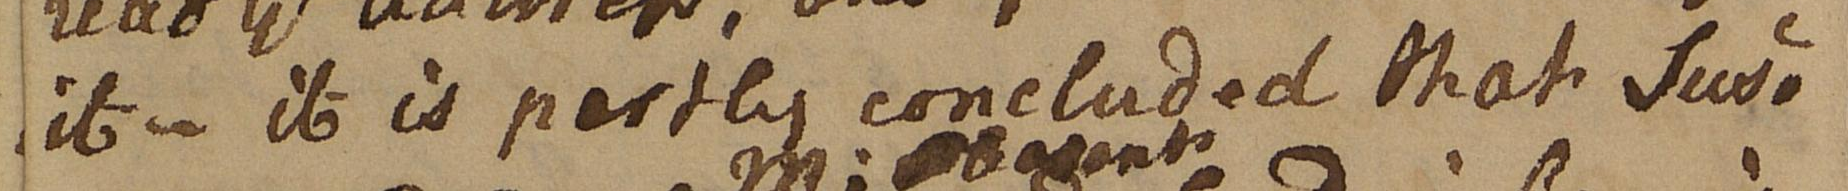it- it is partly concluded that Sus^e.
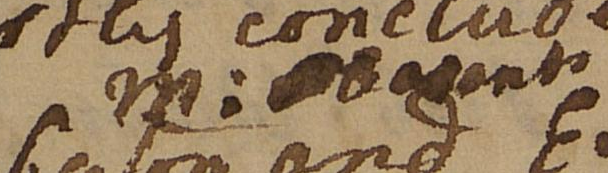M: Plasants
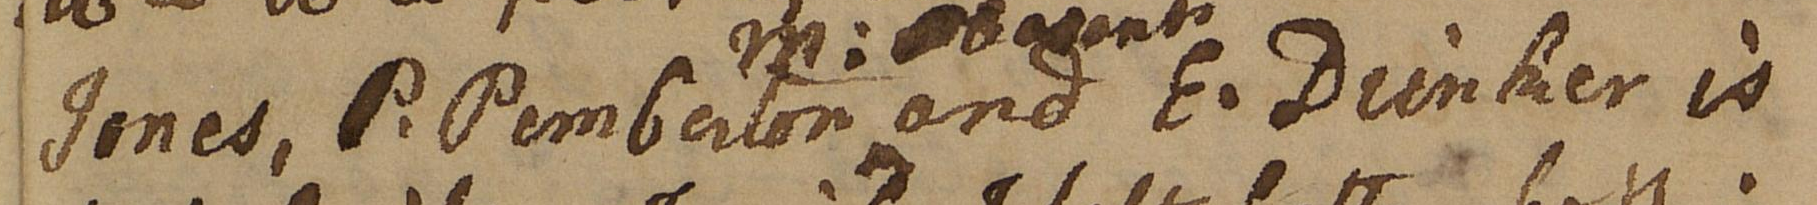Jones, P. Pemberton ^ and E. Drinker is
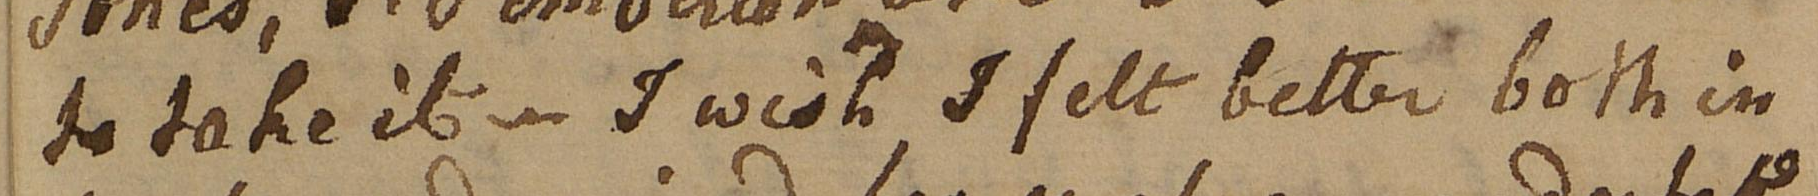to take it- I wish I felt better both in
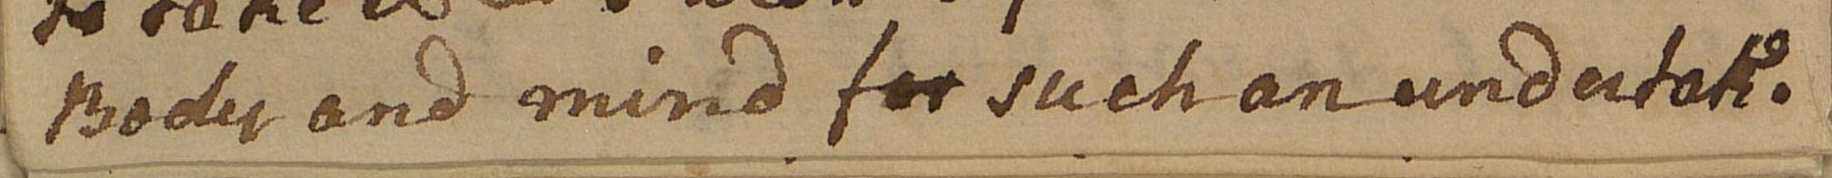Body and mind for such an undertak^g.
